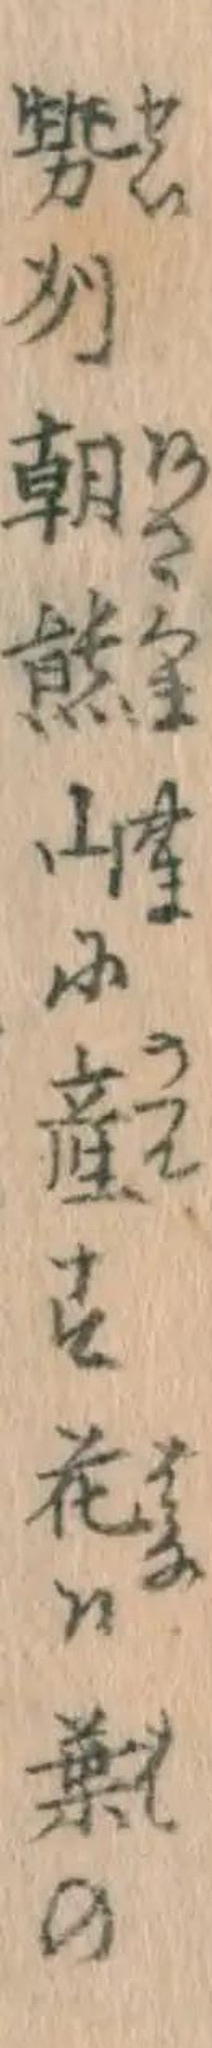勢州朝熊山に産す花は葉の
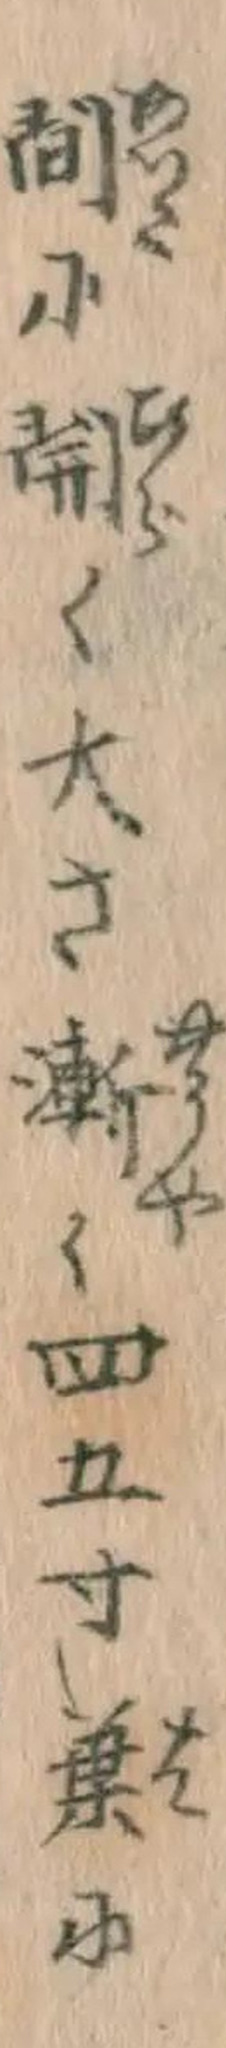間に開く大さ漸く四五寸葉に
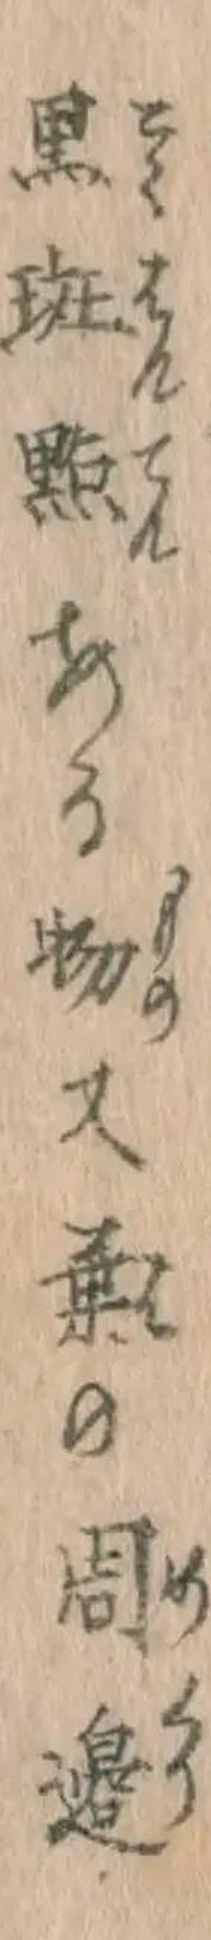黒斑点ある物又葉の周辺
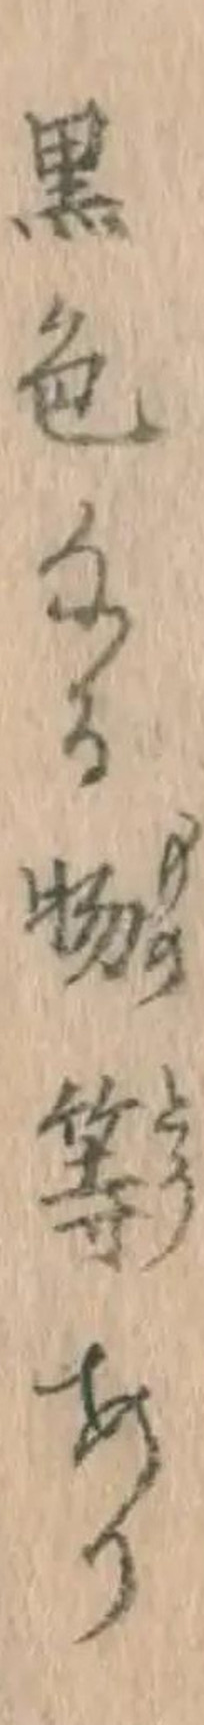黒色なる物等あり
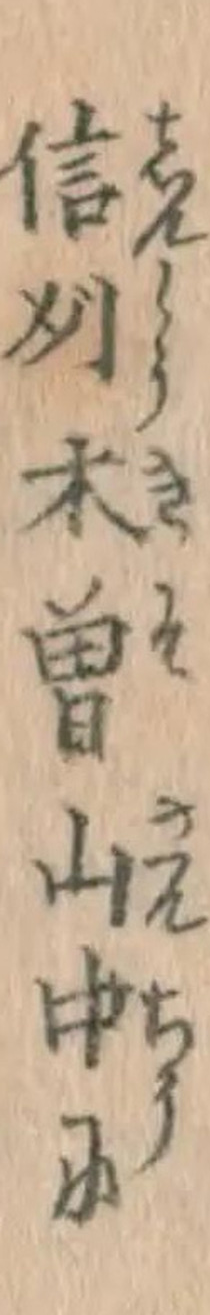信州木曽山中に
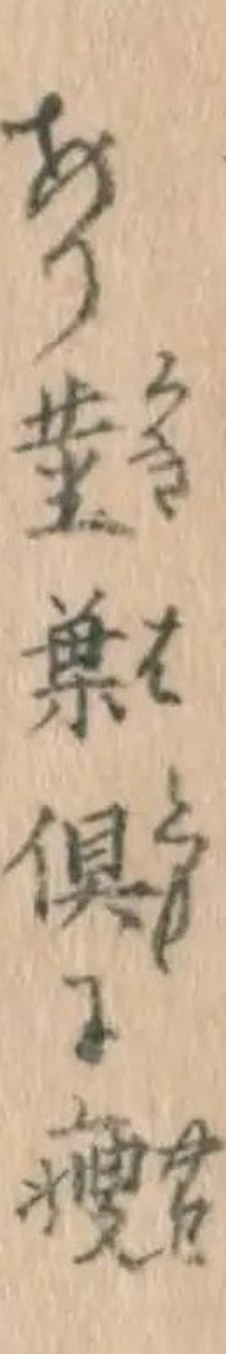あり茎葉倶に痩
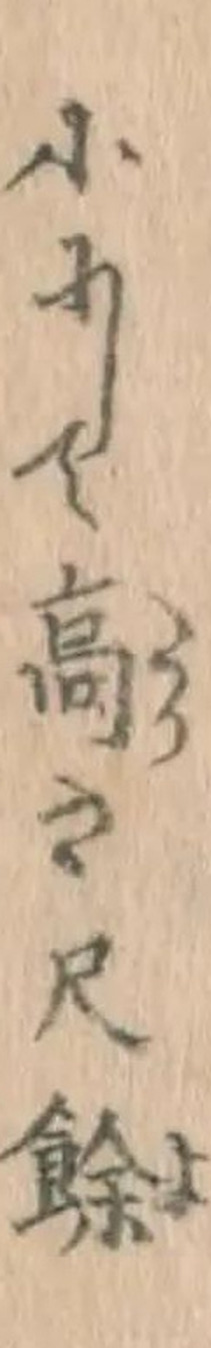小にして高さ尺余
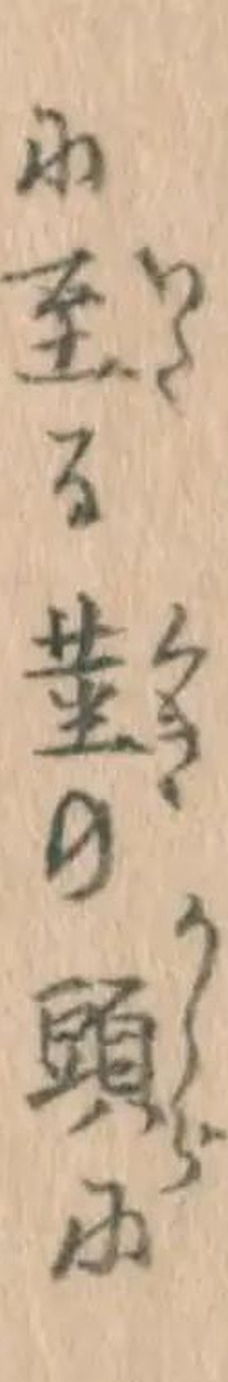に至る茎の頭に
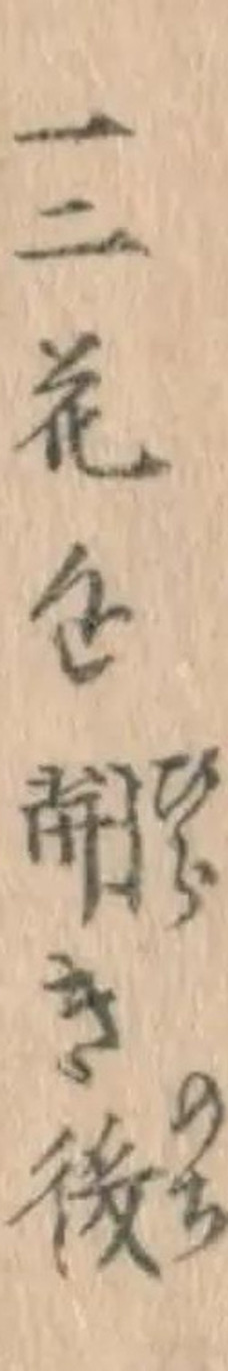一二花を開き後
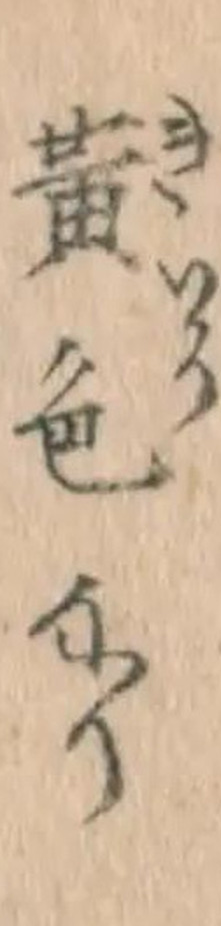黄色なり

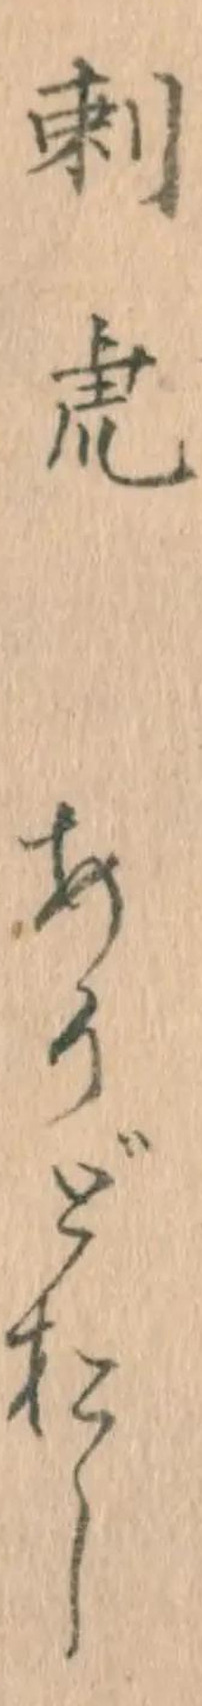剌虎ありどおし
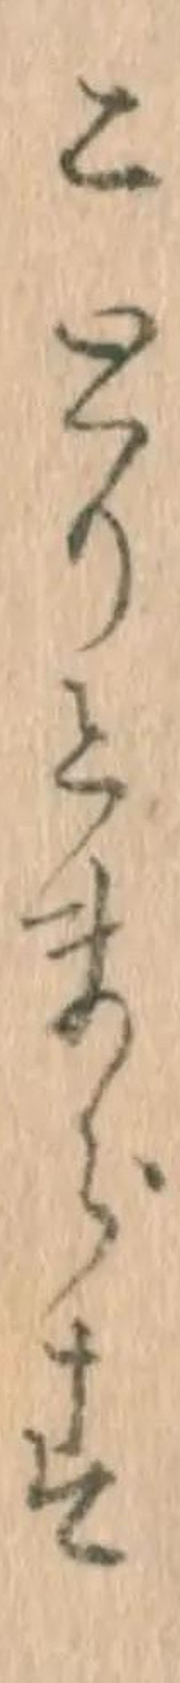ことりとまらす
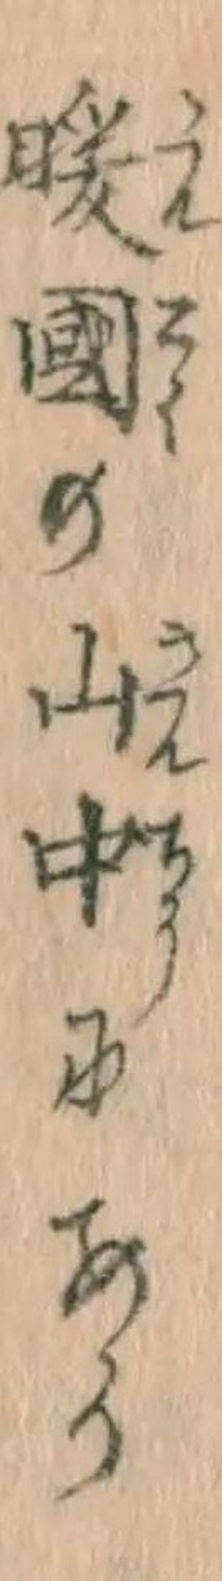暖国の山中にあり
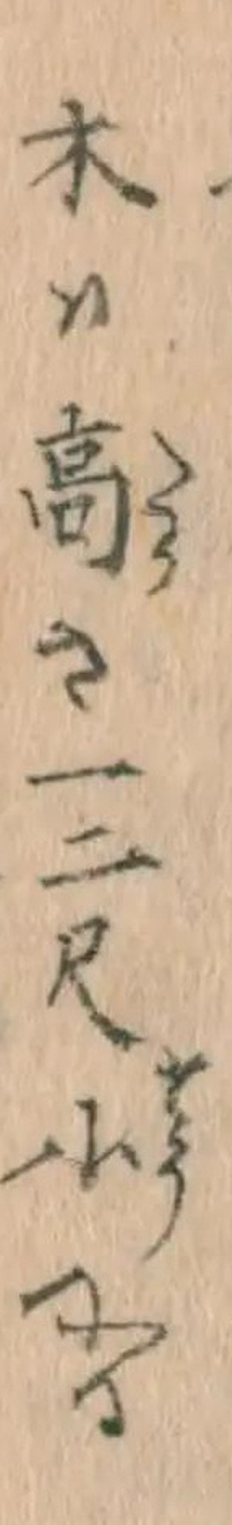木は高さ一二尺小なる
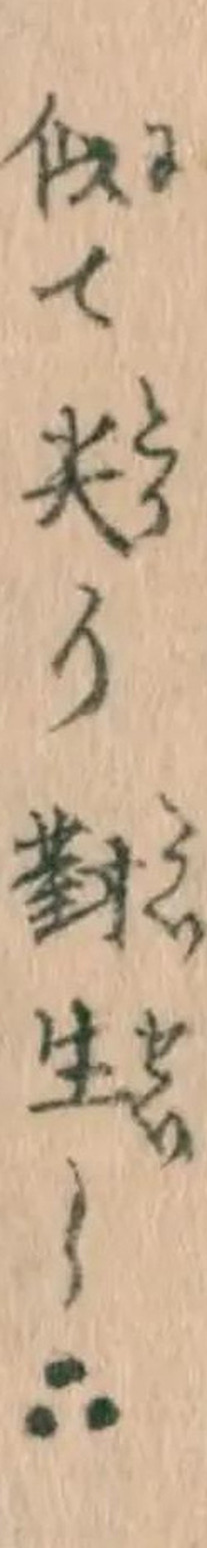似て尖り対生し∴
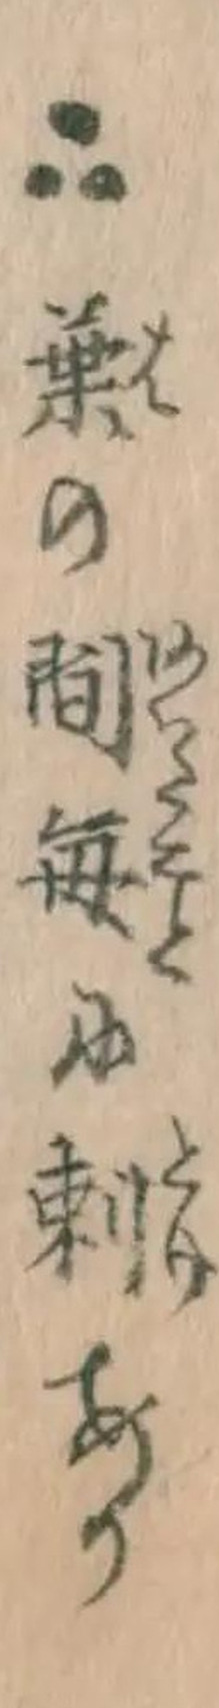∴葉の間毎に剌あり
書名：本草図譜. 巻37-39
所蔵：国立国会図書館 National Diet Library, JAPAN
